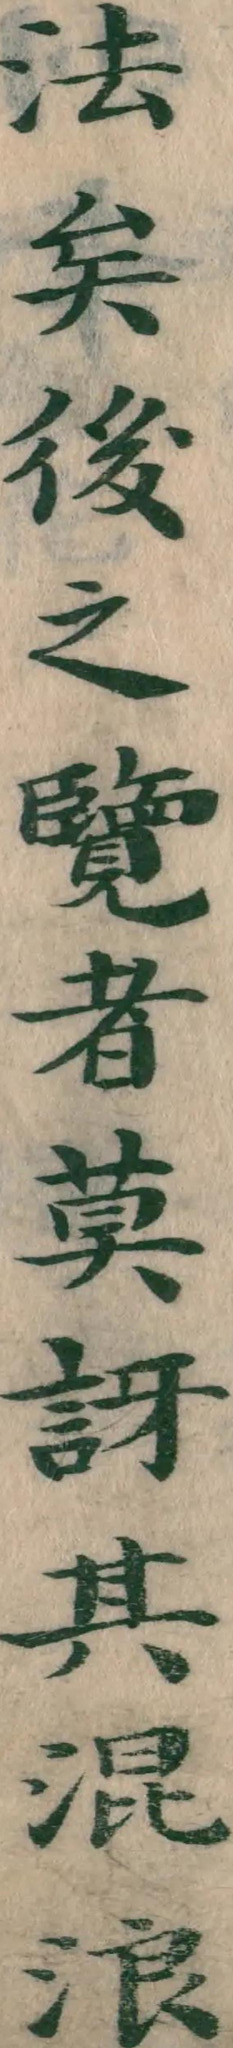法矣後之覧者莫訝其混浪

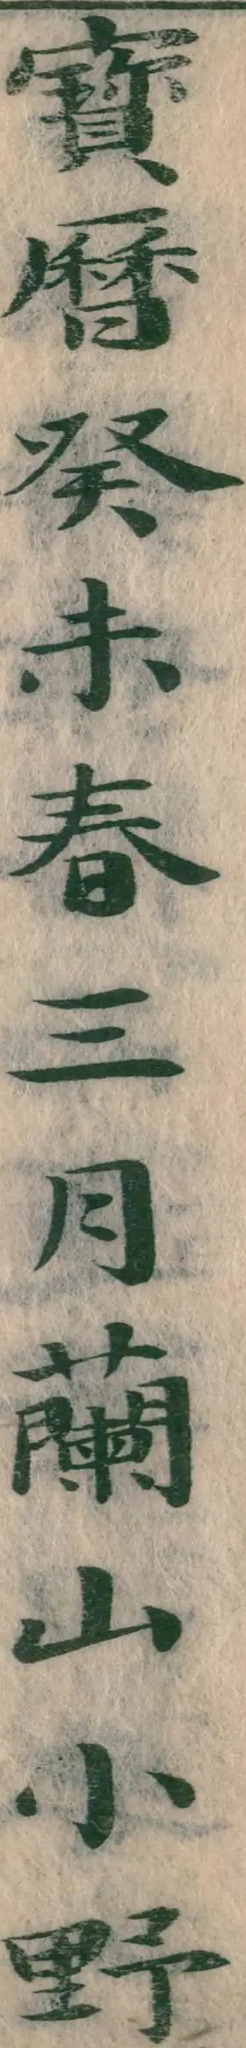宝暦癸未春三月蘭山小野
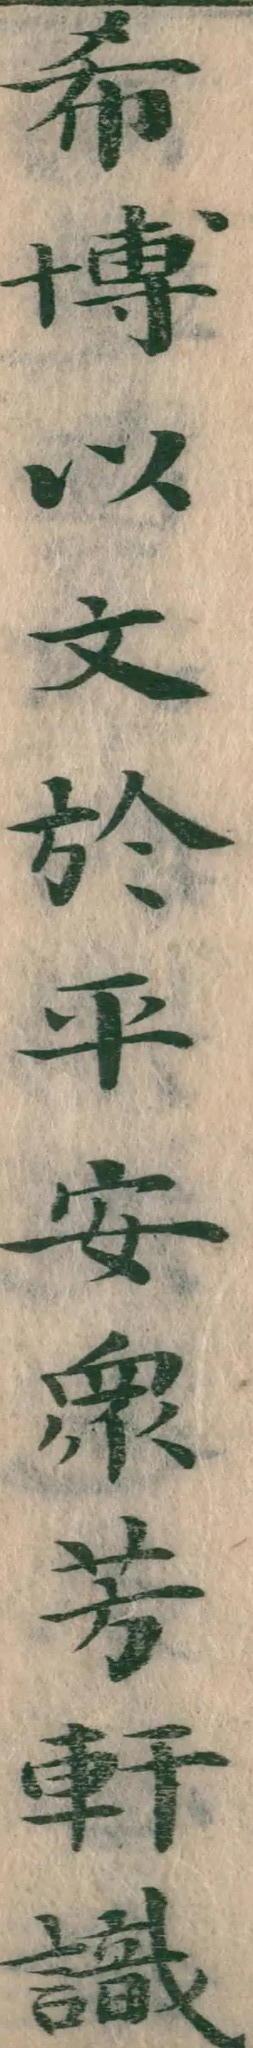希博以文於平安衆芳軒識
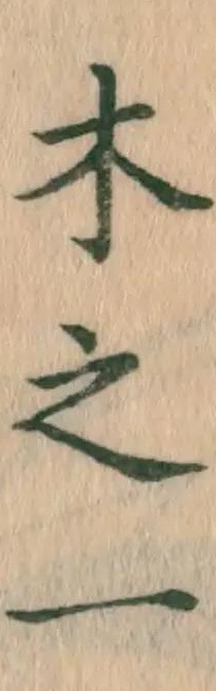木之一
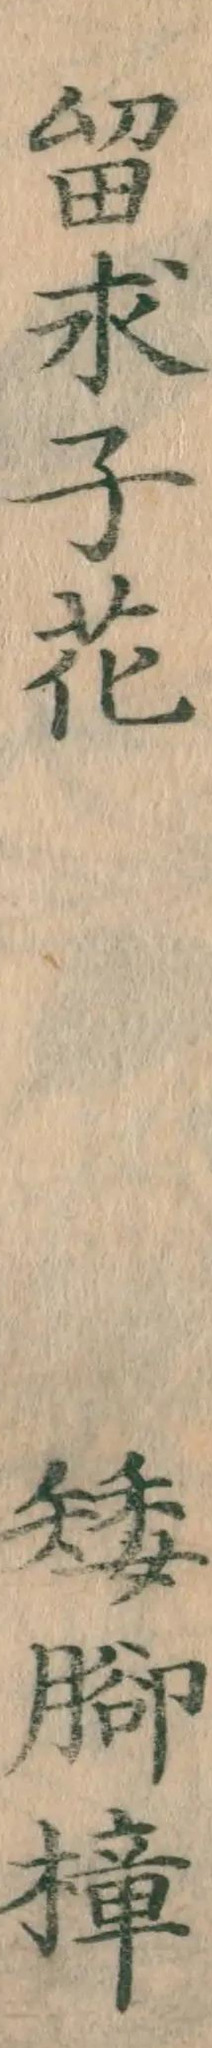留求子花矮脚樟
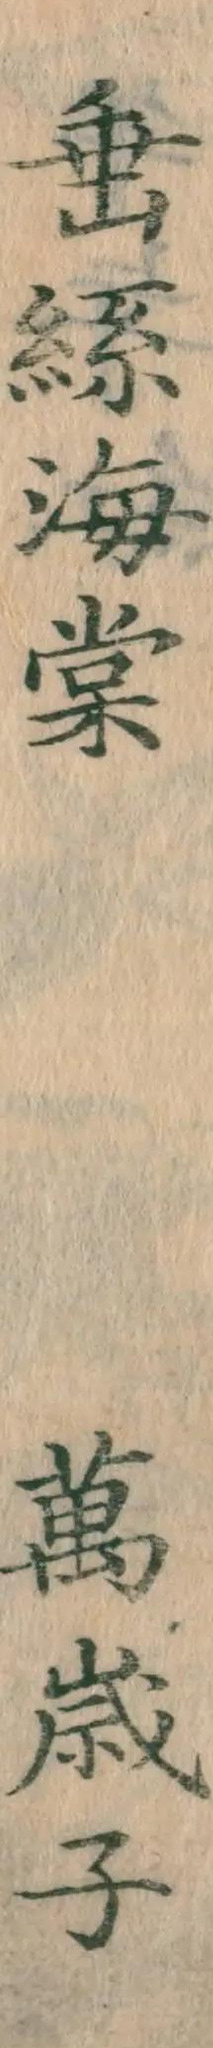垂糸海棠万歳子
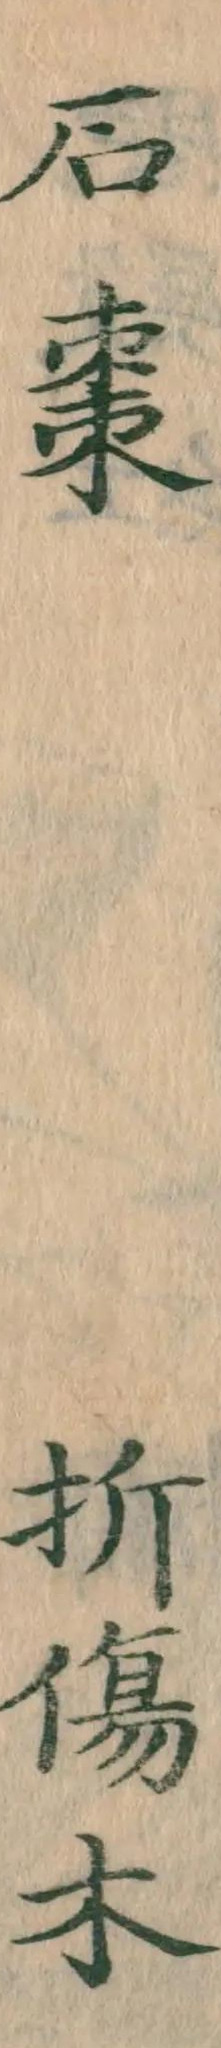石棗折傷木
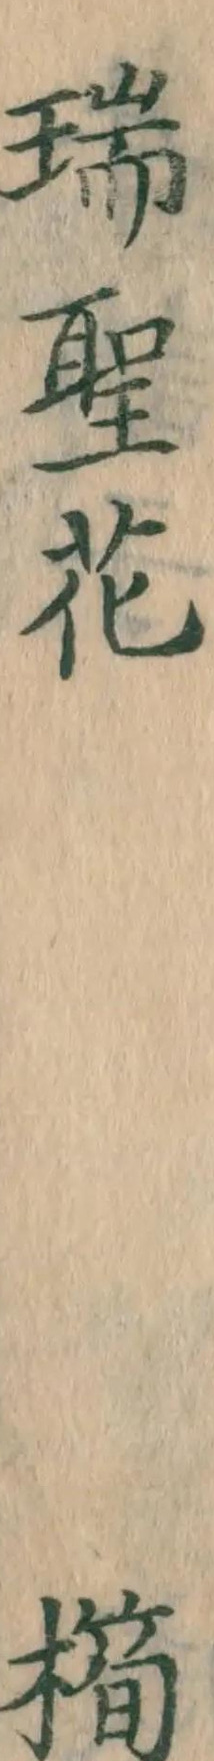瑞聖花橁

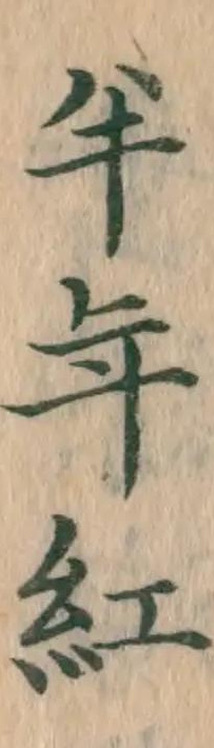半年紅
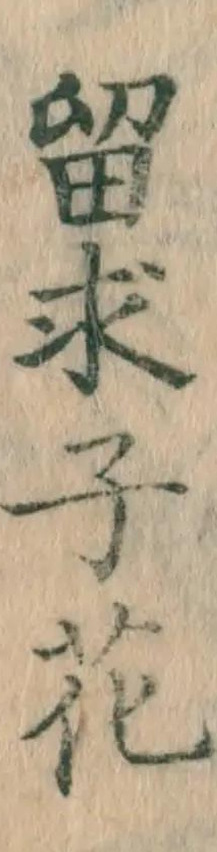留求子花

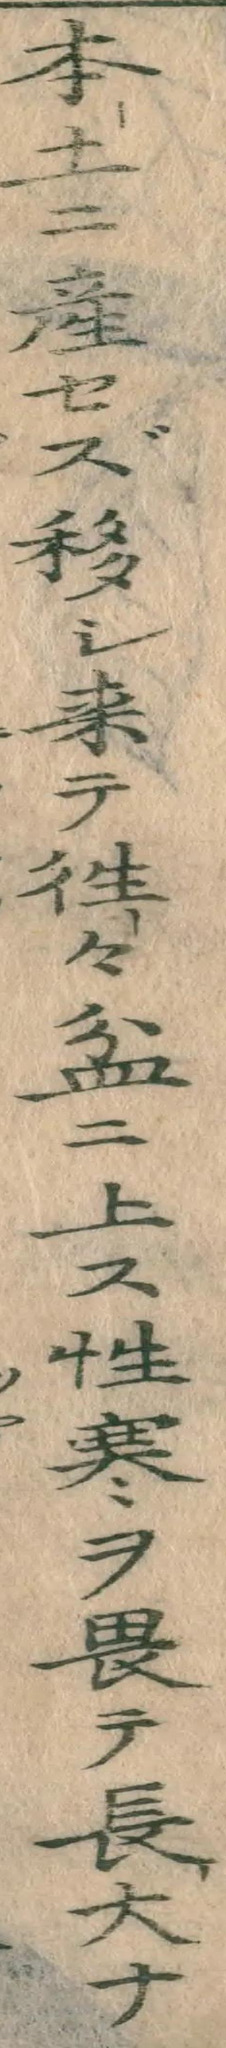本-土ニ産セズ移シ来テ往-々盆ニ上ス性寒ヲ畏テ長-大ナ
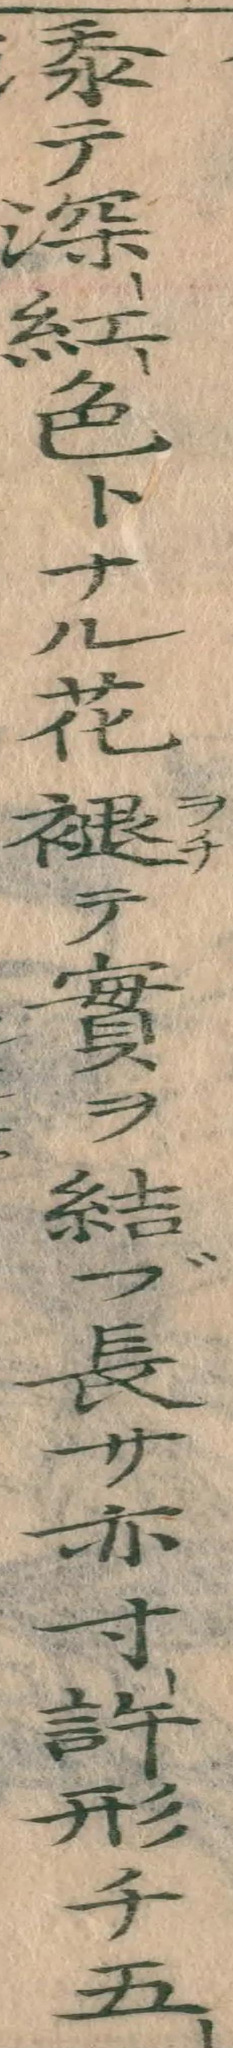添テ深-紅-色トナル花褪テ実ヲ結ブ長サ亦寸-許形チ五-
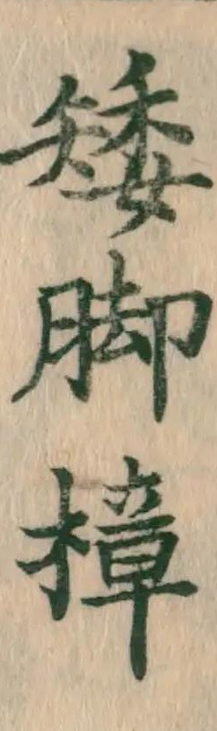矮脚樟

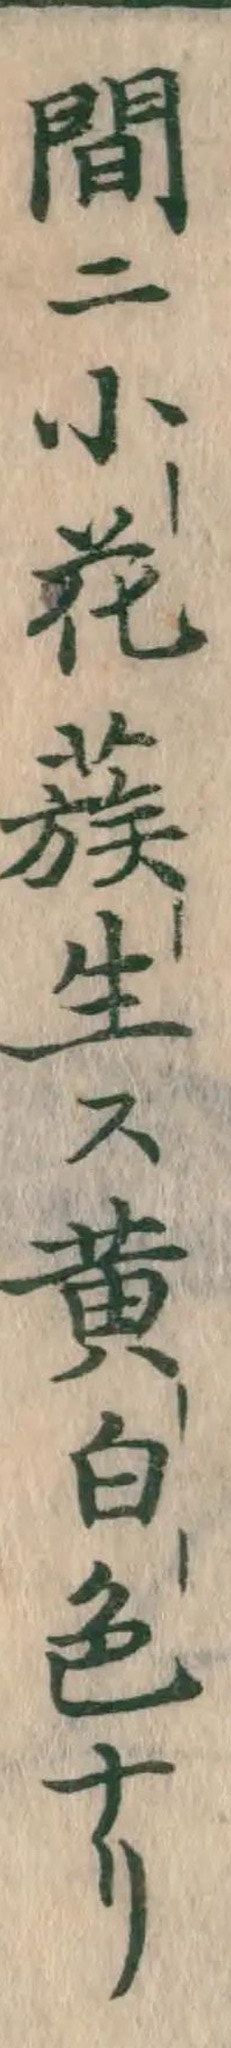間ニ小-花簇-生ス黄-白-色ナリ
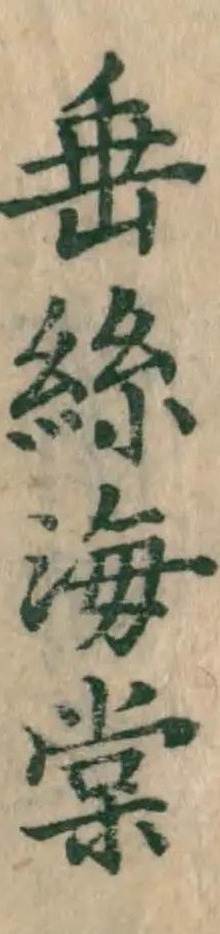垂糸海棠

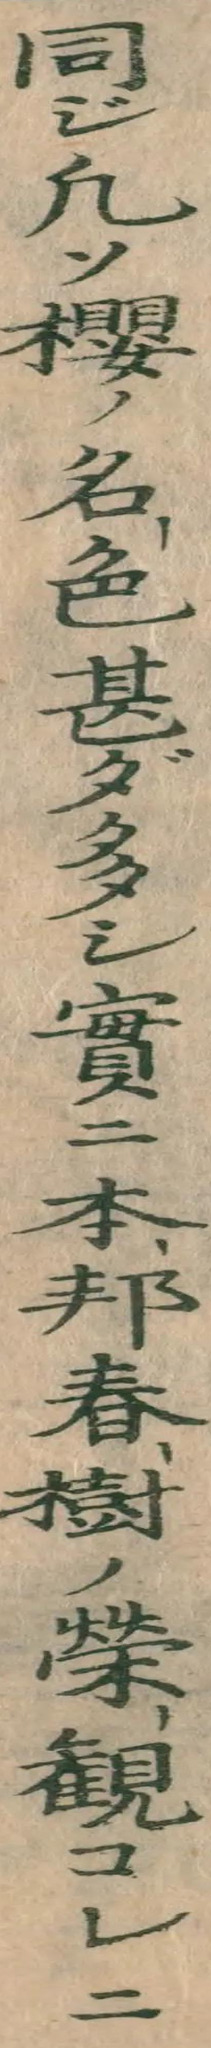同ジ凡ソ桜ノ名-色甚ダ多シ実ニ本-邦春-樹ノ栄-観コレニ
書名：花彙 草部4巻木部4巻. [2]
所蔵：国立国会図書館 National Diet Library, JAPAN
